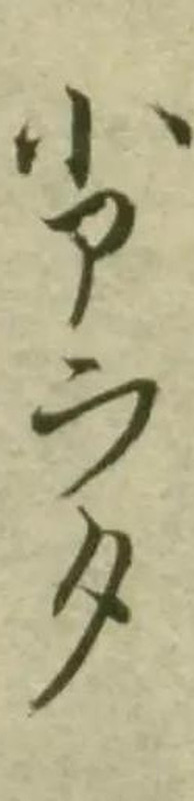小アラタ
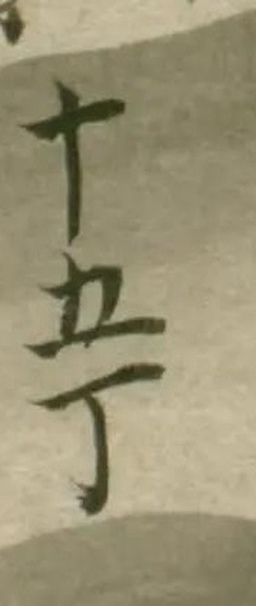十五丁
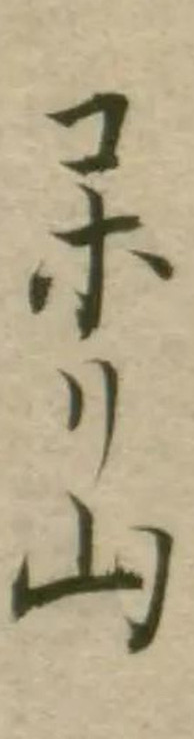コホリ山

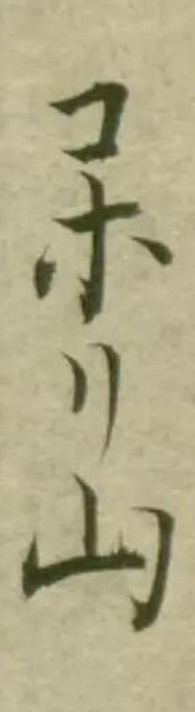コホリ山
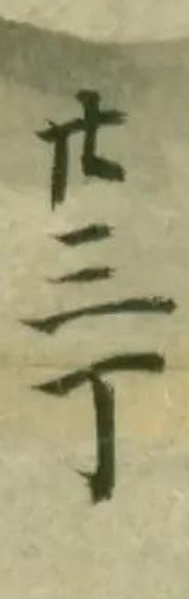廿三丁
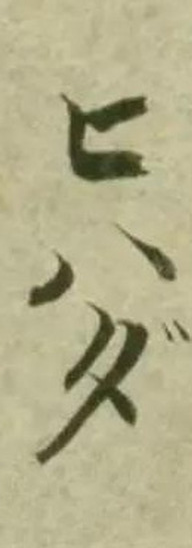ヒハダ
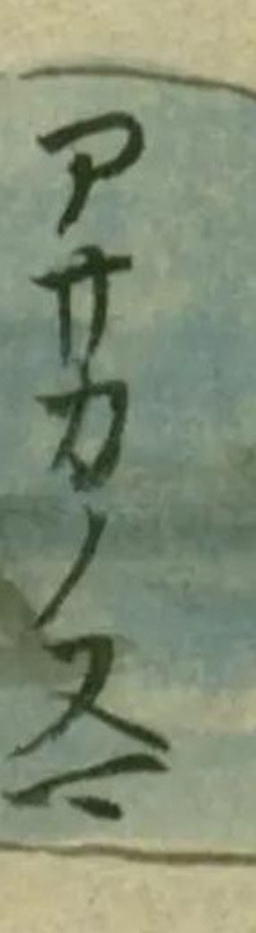アサカノヌマ
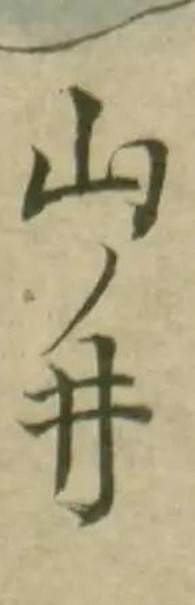山ノ井
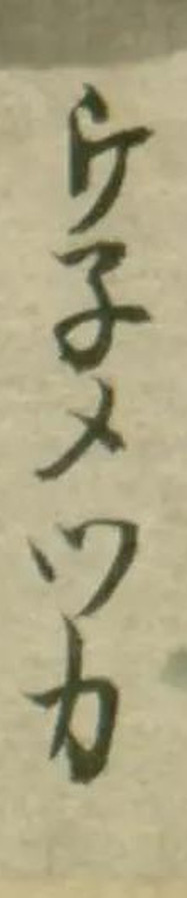ウネメツカ

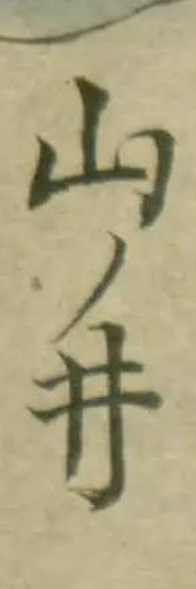山ノ井
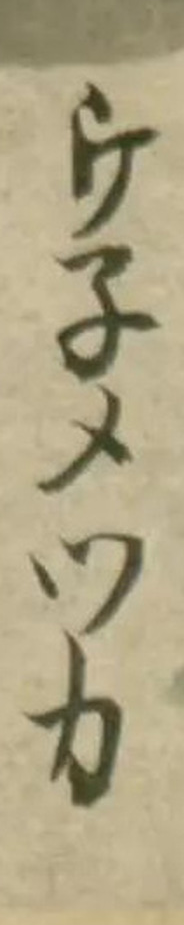ウネメツカ
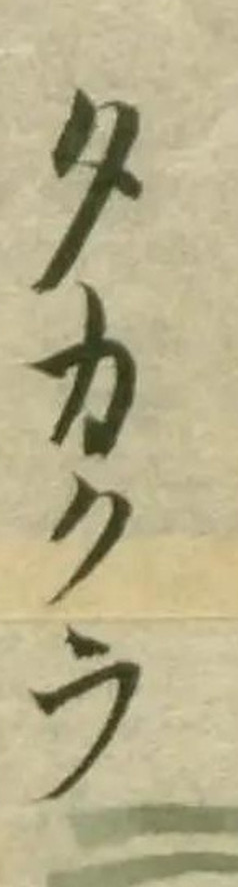タカクラ
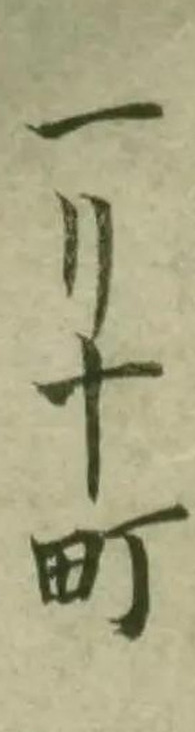一リ十町
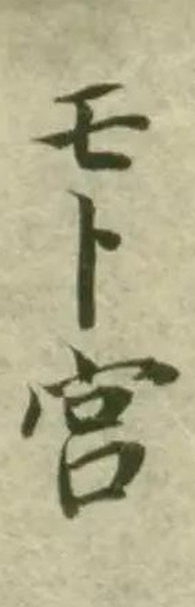モト宮

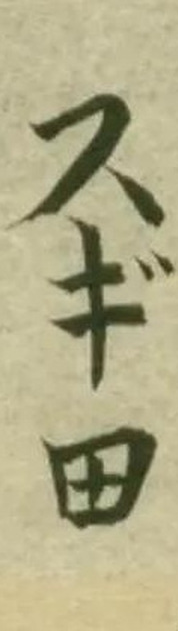スギ田

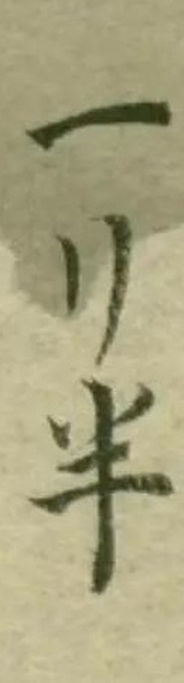一リ半
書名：江戸より奥州津輕迄道筋之圖
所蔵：国立国会図書館 National Diet Library, JAPAN
